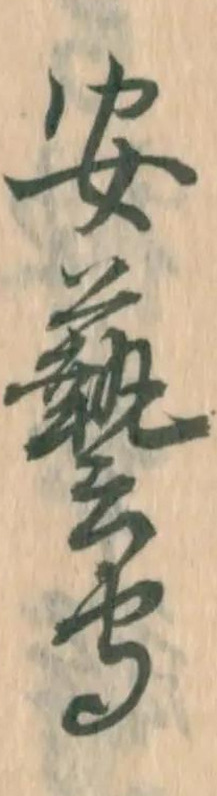安藝守
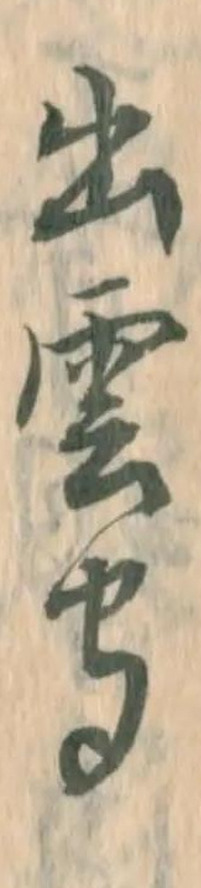出雲守
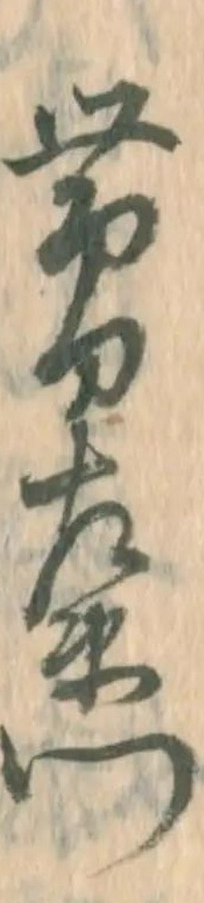帯刀左衛門
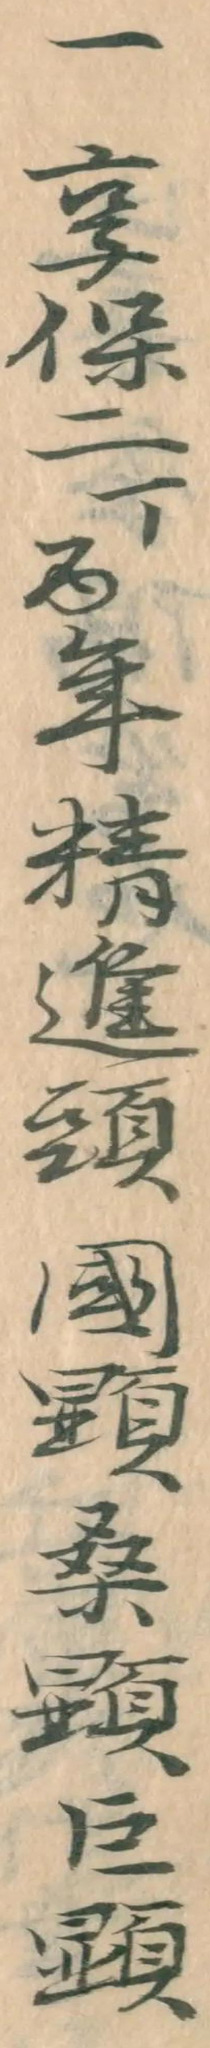一、享保二丁酉年精進頭國顕桑顕巨顕

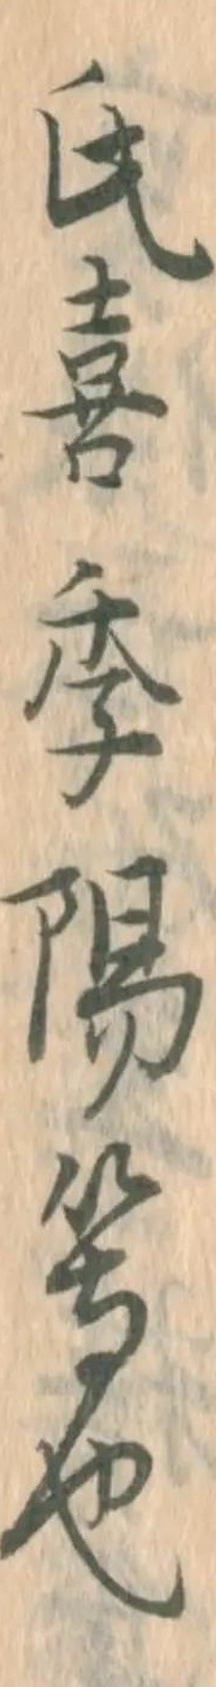氏喜季陽等也
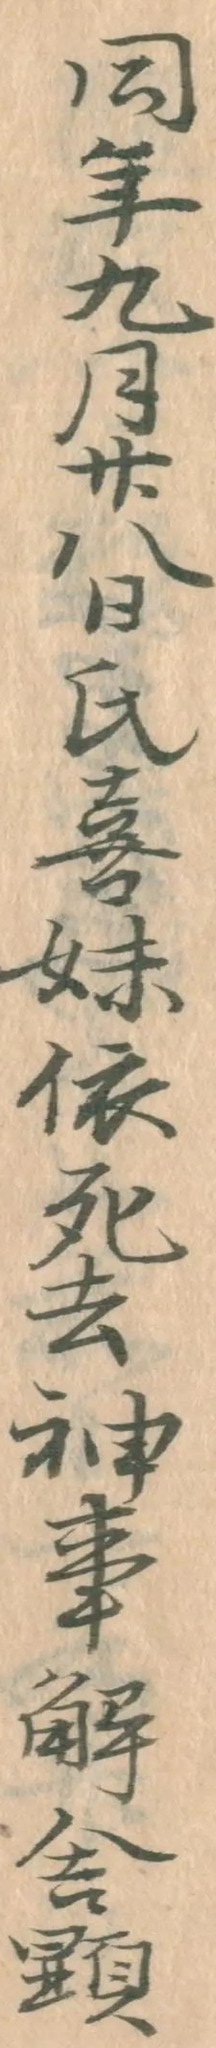同年九月廿八日氏喜妹依死去神事解舎顕
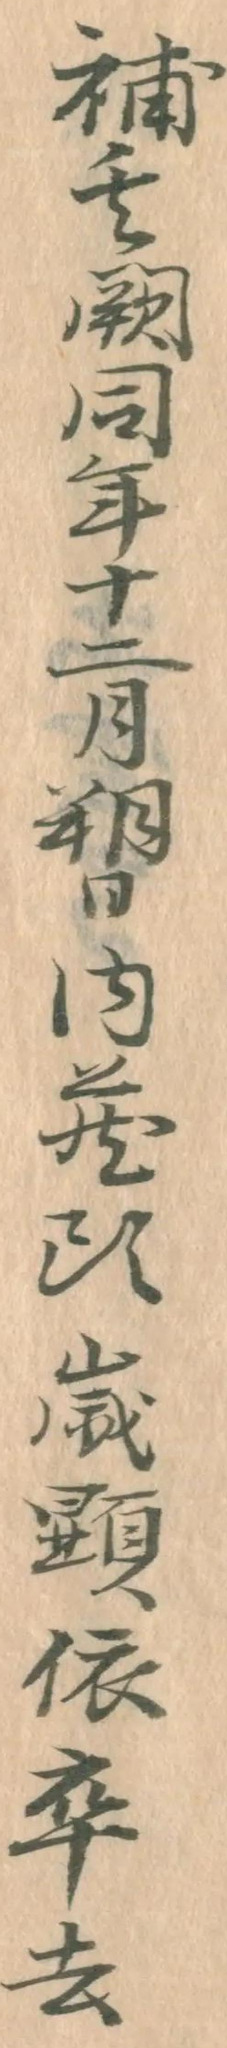補其闕同年十二月朔日内蔵頭歳顕依卒去
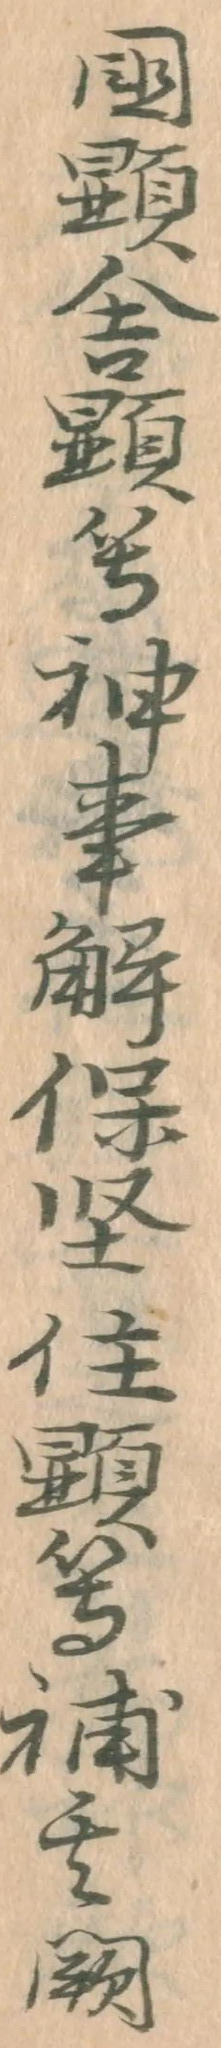國顕舎顕等神事解保堅住顕等補其闕
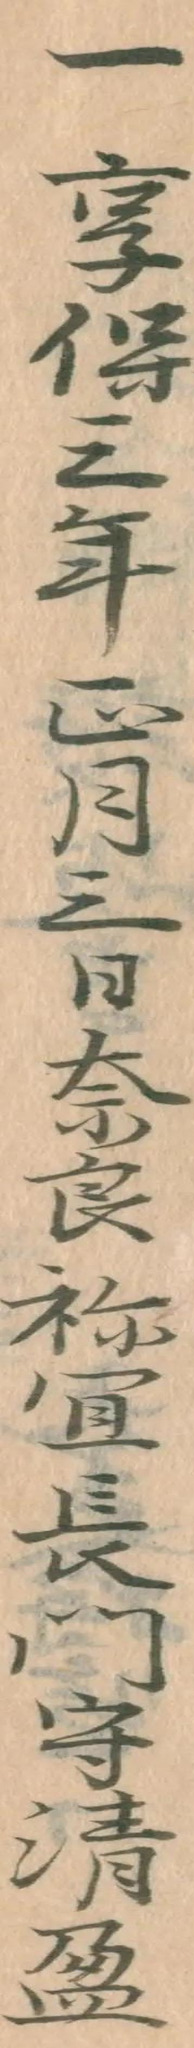一、享保三年正月三日奈良称宜長門守清盈
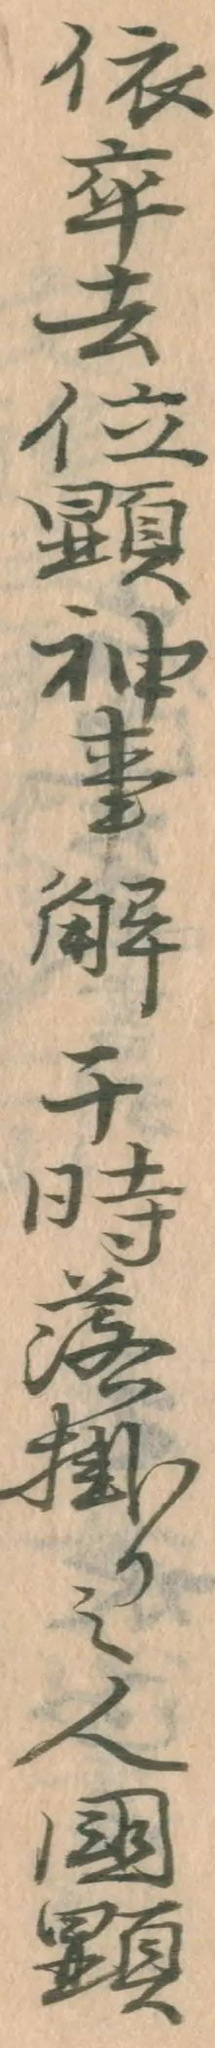依卒去位顕神事解于時落掛リ之人國顕
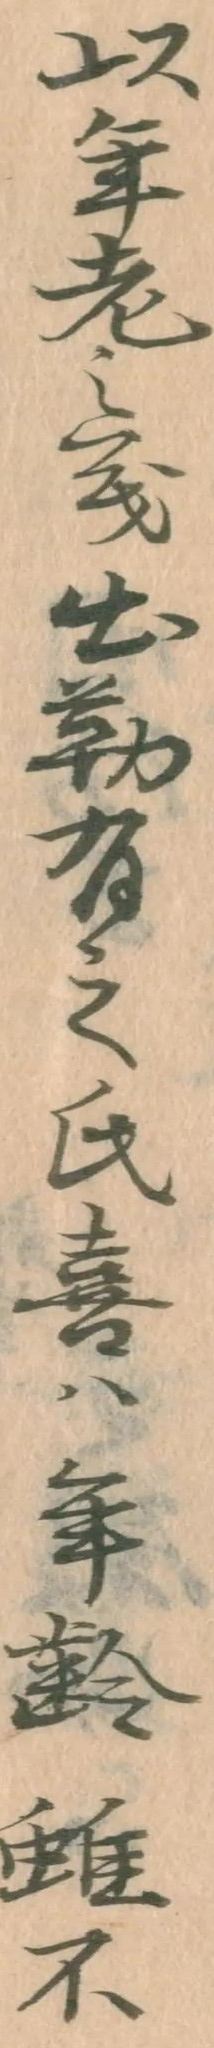以年老之義出勤有之氏喜ハ年齢雖不
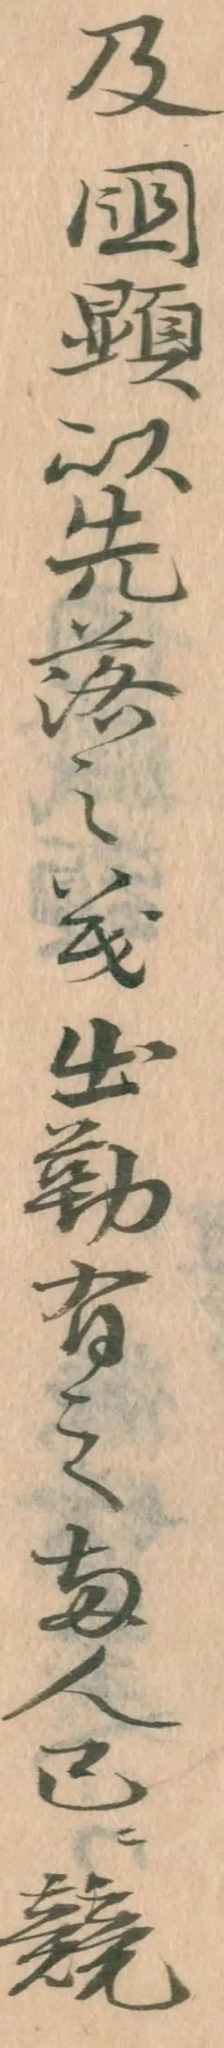及國顕以先落之義出勤有之両人已ニ競
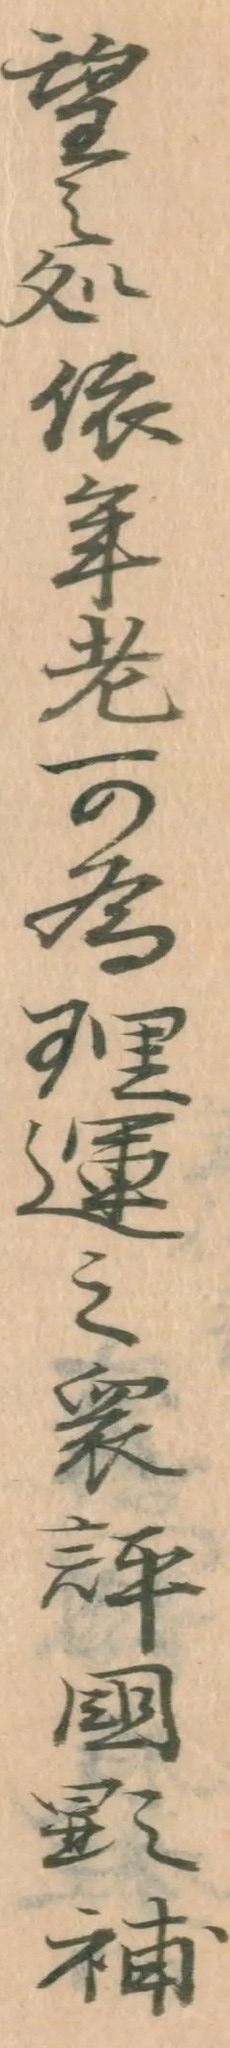望之処依年老可為理運之衆評國顕補
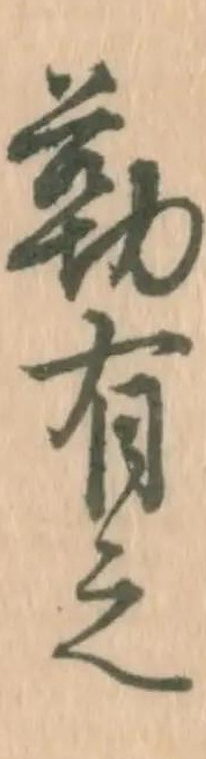勤有之
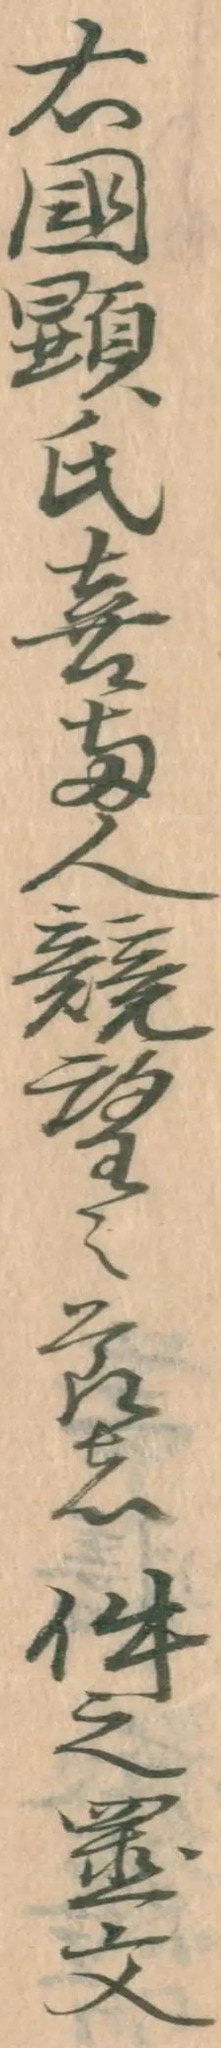右國顕氏喜両人競望之節者件之置文
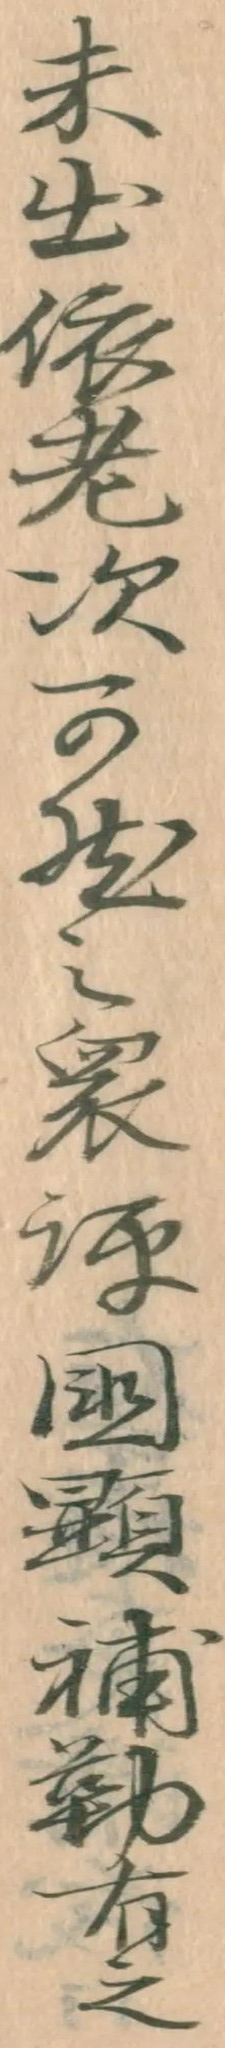未出依老次可然之衆評國顕補勤有之
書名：賀茂社記録. 第39冊
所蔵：国立国会図書館 National Diet Library, JAPAN
